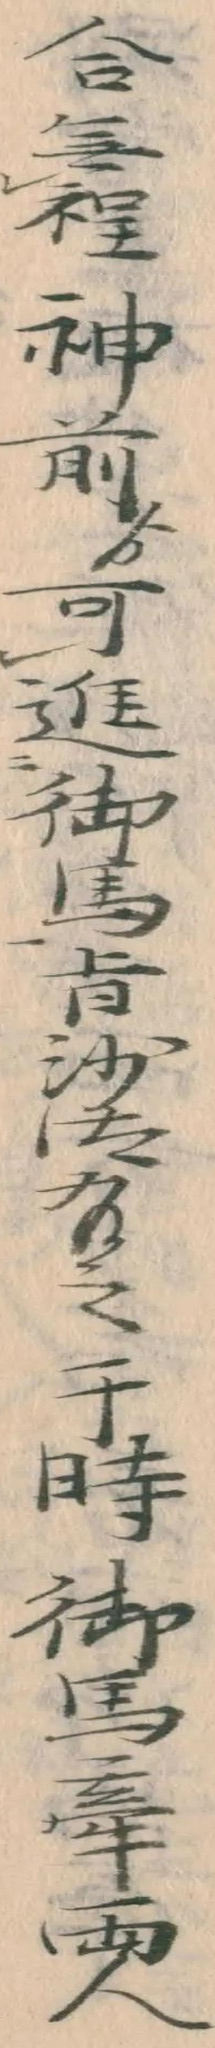合無程神前ゟ可進御馬旨沙汰有之于時御馬牽両人
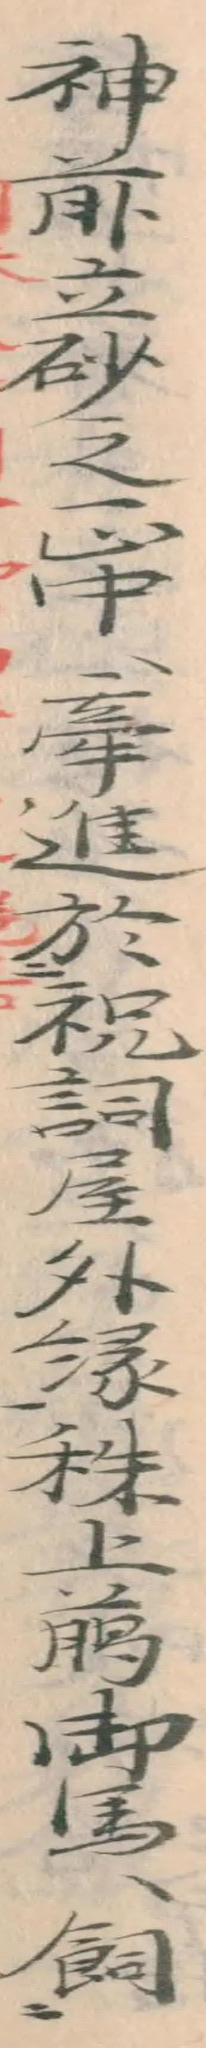神前立砂之正中へ牽進於祝詞屋外縁秼上臈御馬へ飼
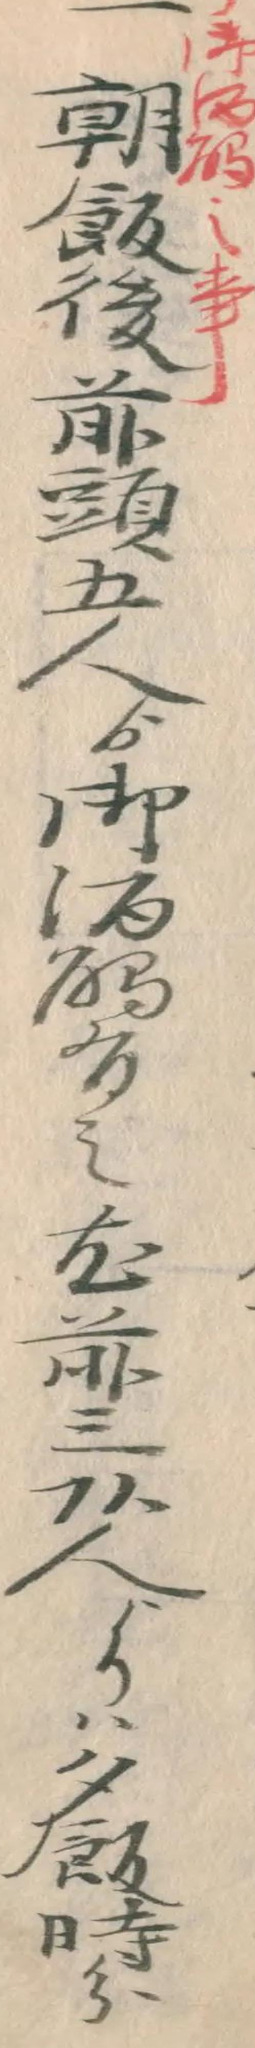一朝飯後前頭五人ゟ御酒触有之尤前三頭人よりは夕飯時分
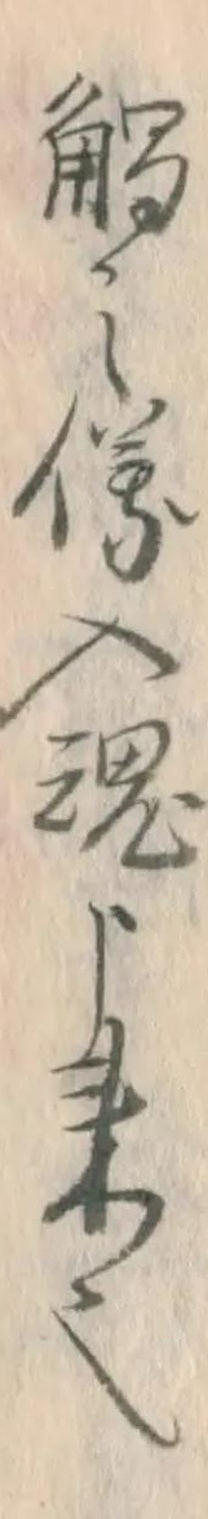触之儀入魂申来也

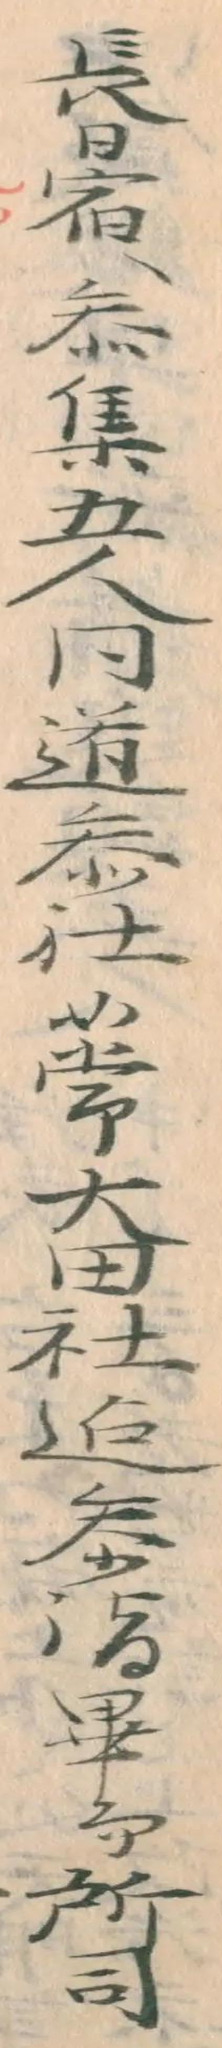長日宿へ参集五人同道参社如常大田社迄参詣畢而所司
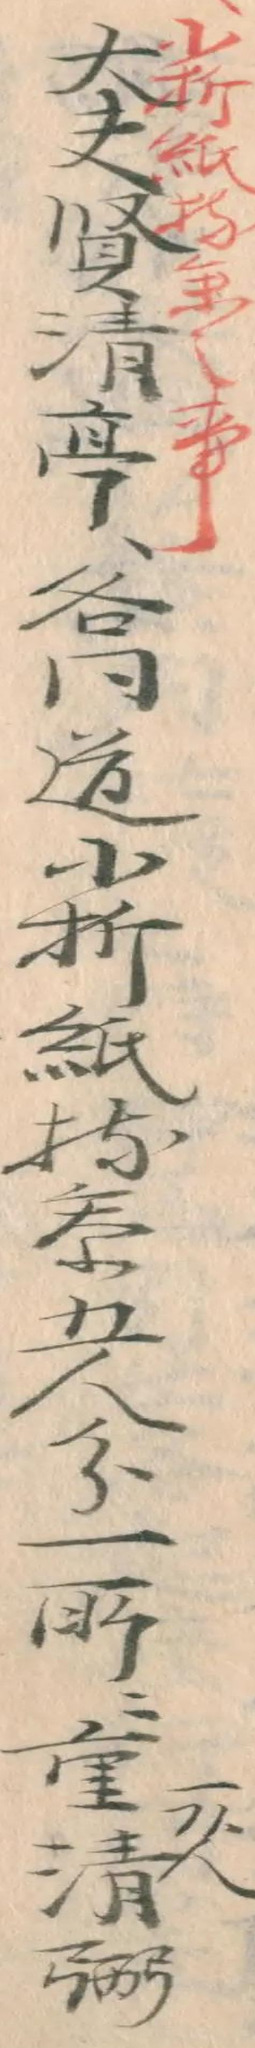大夫賢清亭各同道小折紙持参五人分一所ニ重一頭人清弼
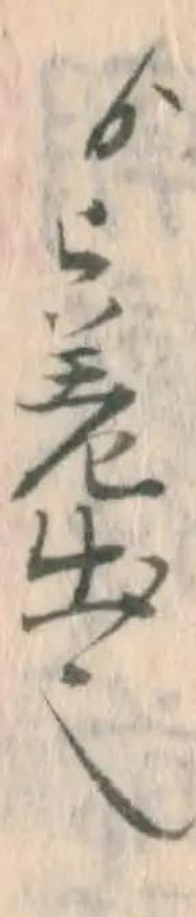ゟ被差出也
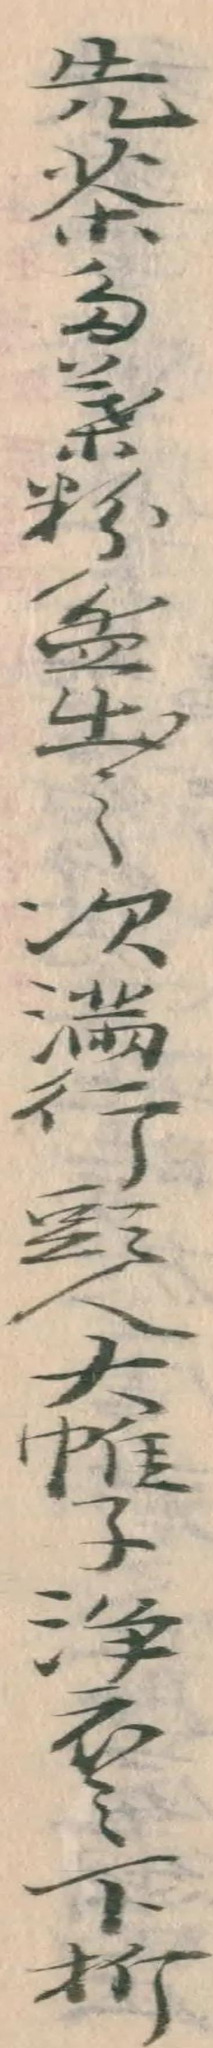先茶両葉粉盆出之次満行頭人大帷子浄衣之下折
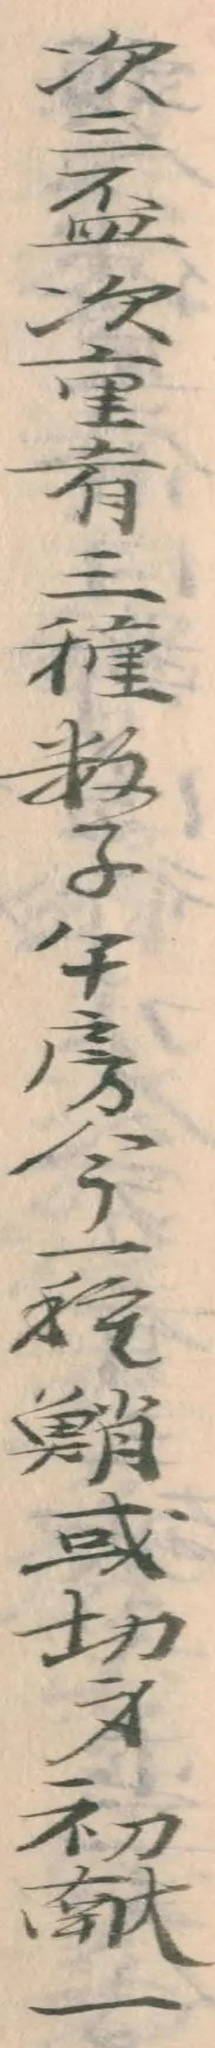次三盃次重有三種数子午房今一種蛸或切身初献一
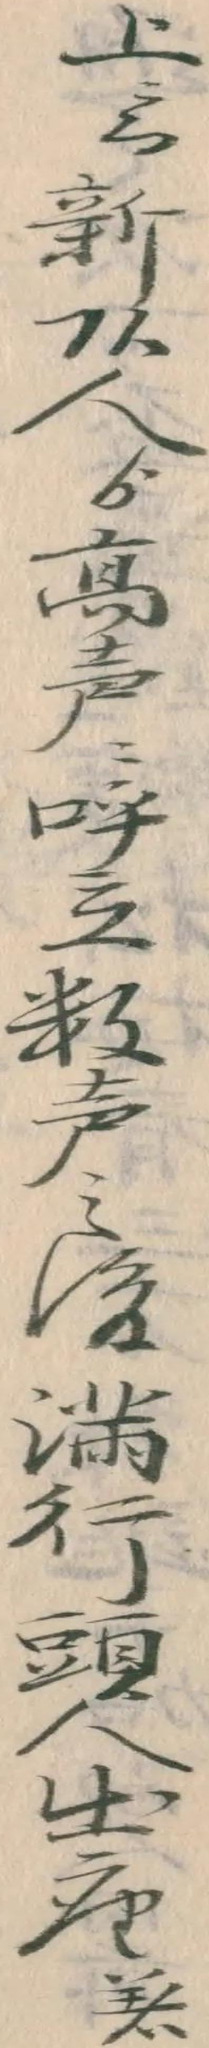上ニ而新頭人ゟ高声ニ呼立数声之後満行頭人出座着
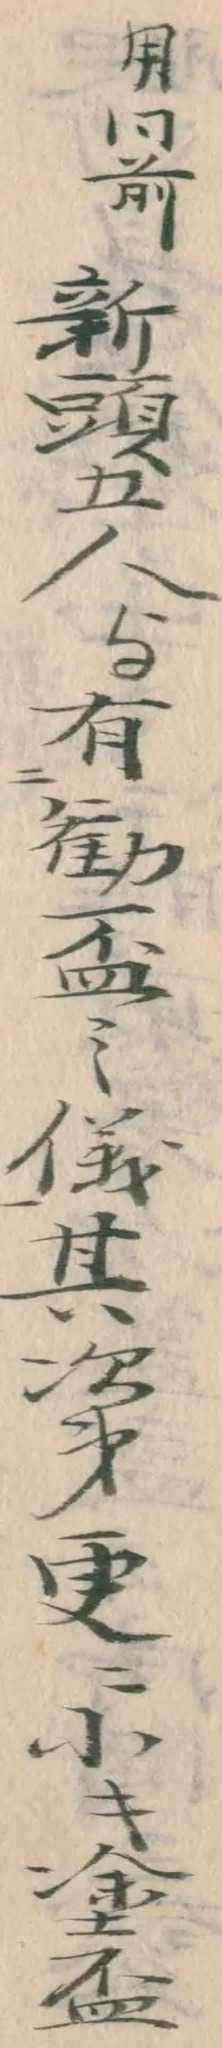用同前新頭五人与有勧盃之儀其次第更ニ小キ塗盃
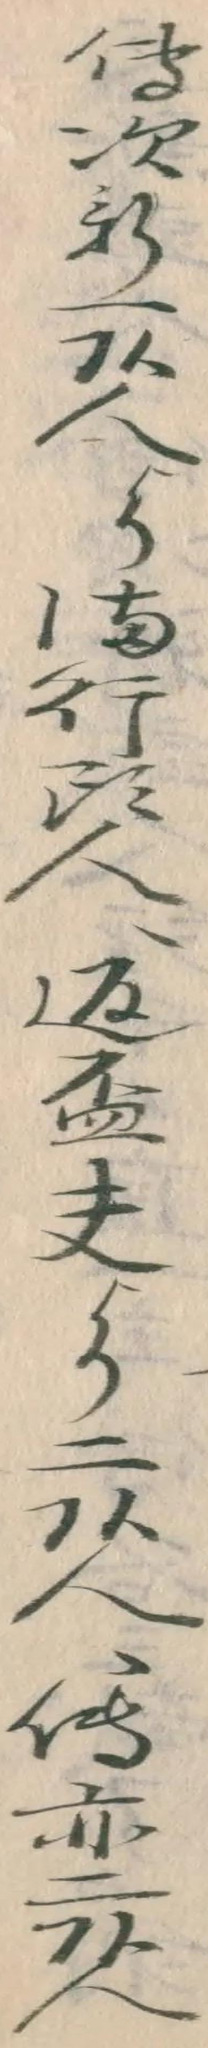傳次新一頭人より満行頭人へ返盃夫より二頭人へ傳亦二頭人
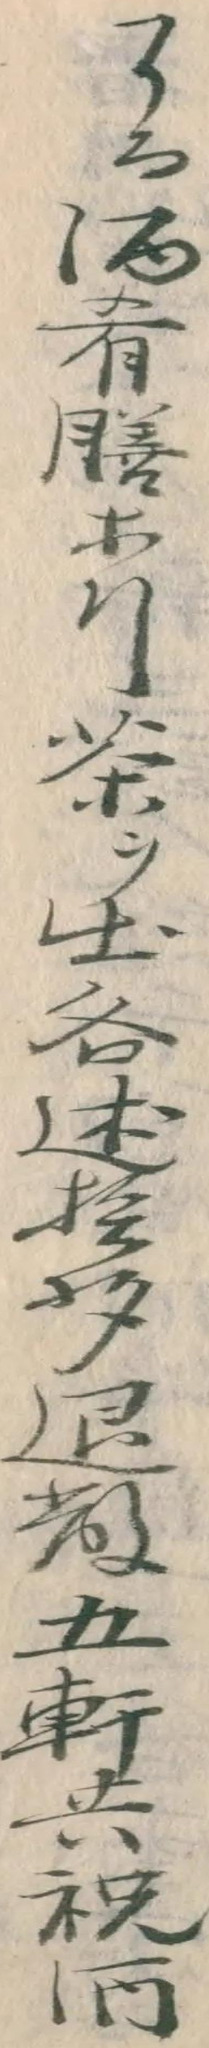了而酒肴膳等引茶ヲ出各述挨拶退散五軒共祝酒
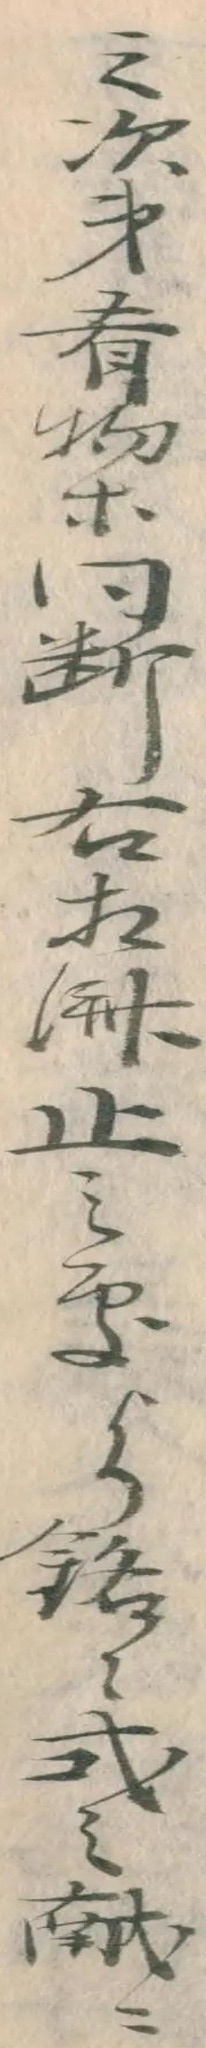之次第肴物等同断右相済止之處より銘々式之献ニ

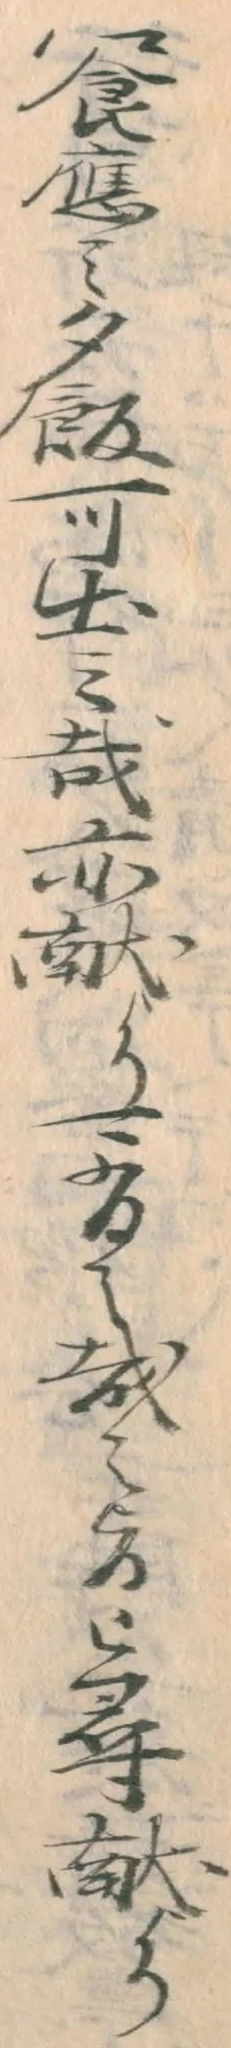饗應之夕飯可出之哉亦献より可有之哉之旨被尋献より
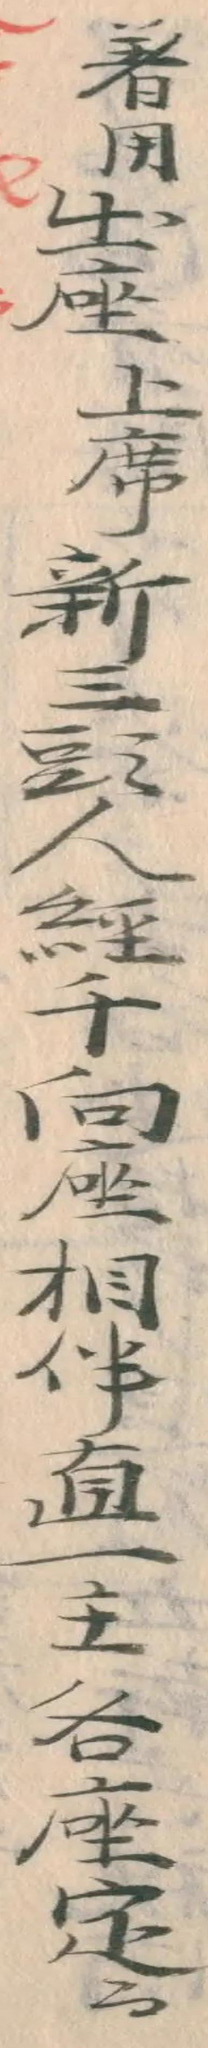着用出座上席新三頭人経千向座相伴直一主各座定而
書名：賀茂社記録. 第72冊
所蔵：国立国会図書館 National Diet Library, JAPAN
